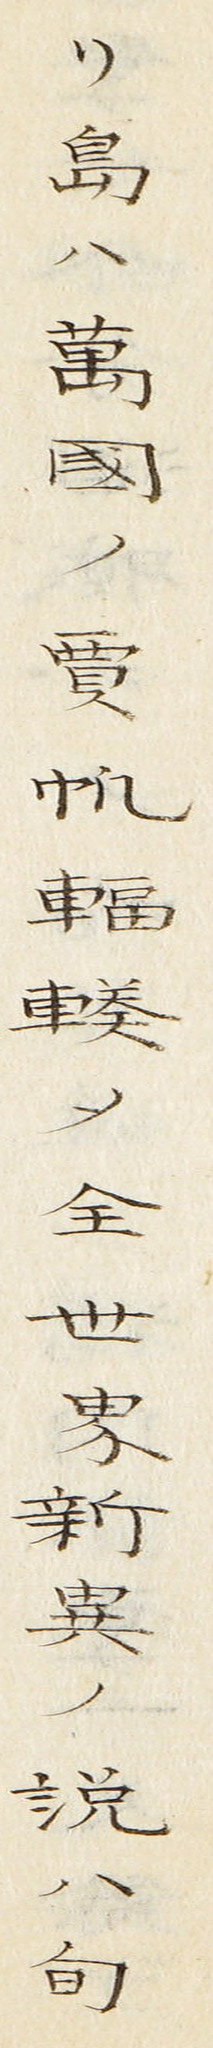リ島ハ万国ノ賈帆輻輳シテ全世界新異ノ説ハ旬
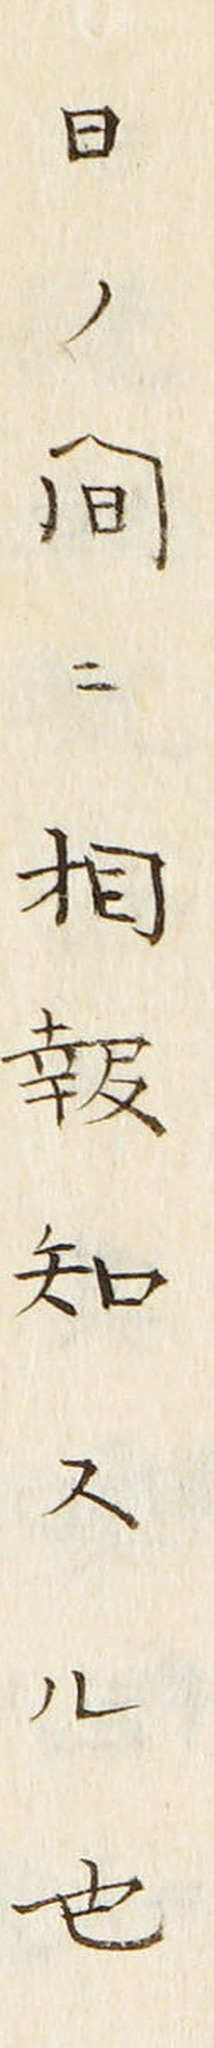日ノ間ニ相報知スル也
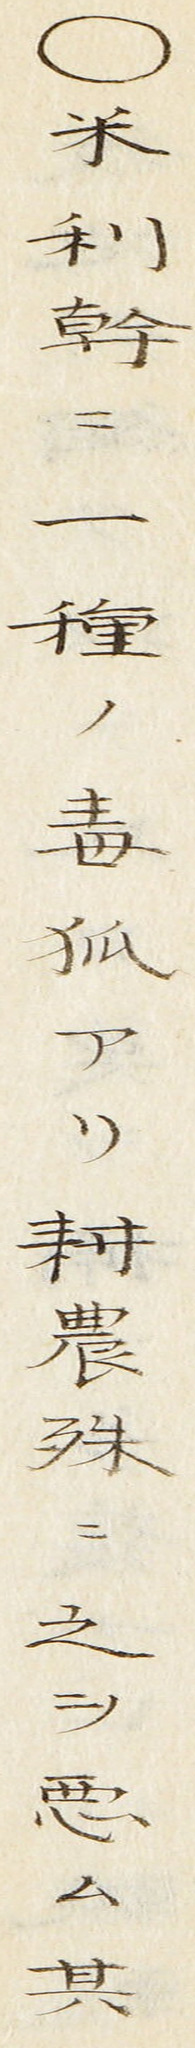〇米利幹ニ一種ノ毒狐アリ耕農殊ニ之ヲ悪ム其
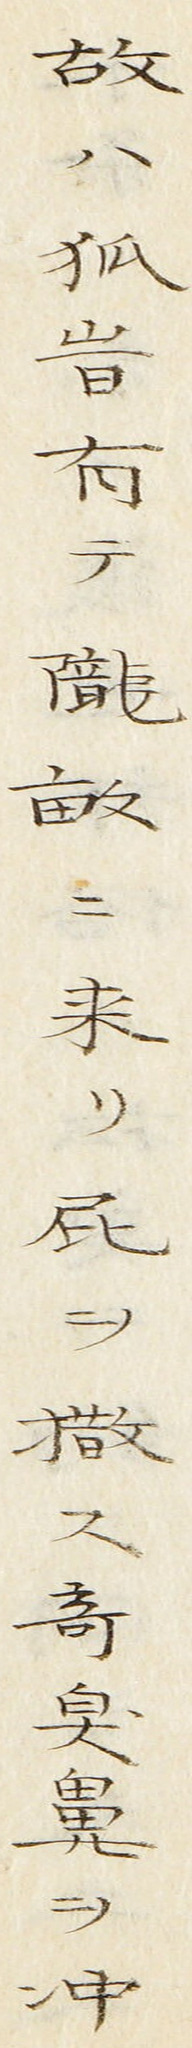故ハ狐旹有テ隴畝ニ来リ屁ヲ撒ス奇臭鼻ヲ冲
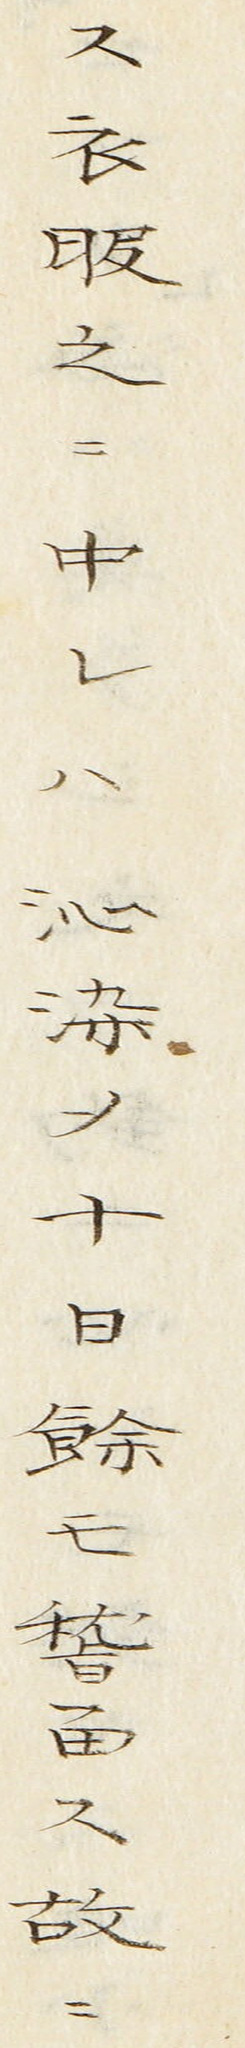ス衣服之ニ中レハ沁染シテ十日余モ稽留ス故ニ
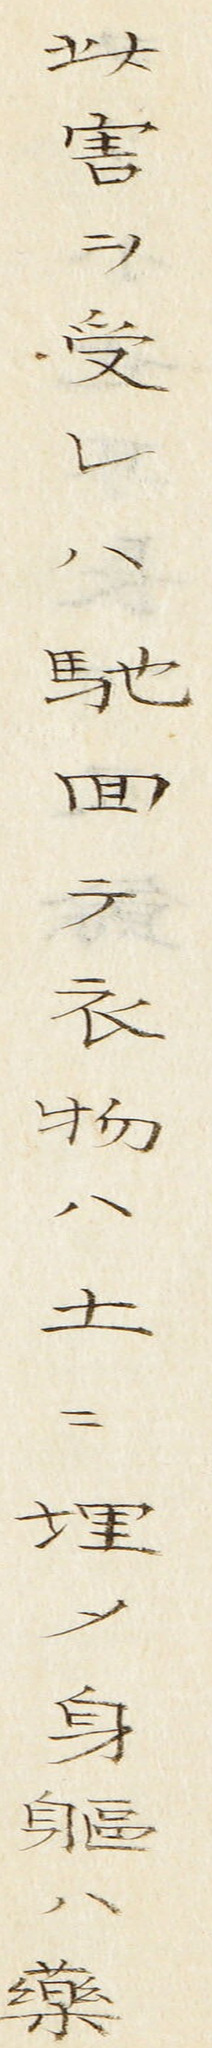此害ヲ受レハ馳回テ衣物ハ土ニ埋メ身躯ハ薬
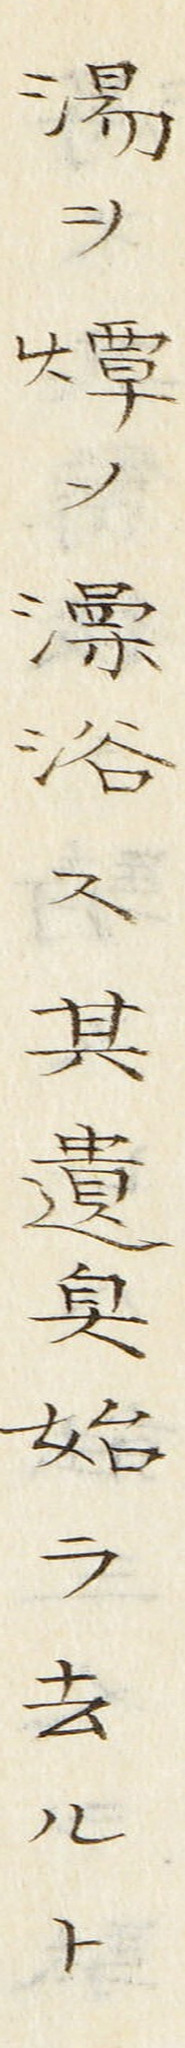湯ヲ燂シテ澡浴ス其遺臭始テ去ルト
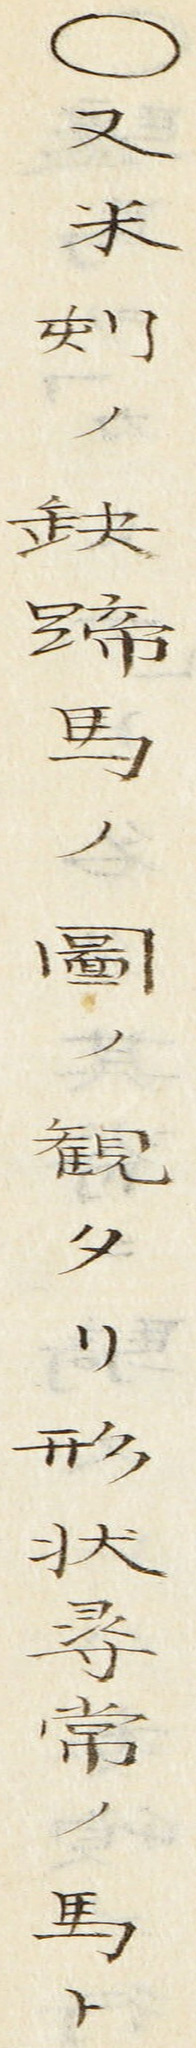〇又米刻ノ缺？蹄馬ノ図ノ観タリ形状常ノ馬ト
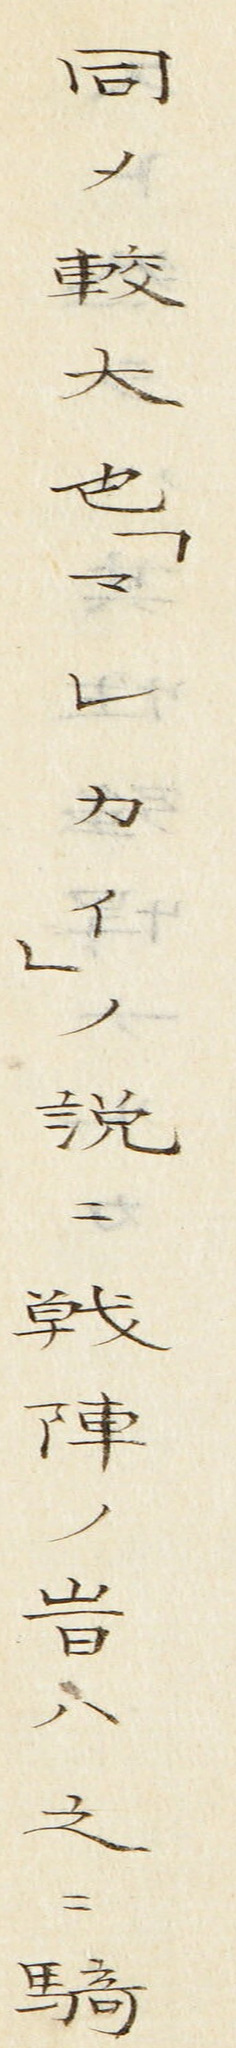同シテ較大也「マレカイ」ノ説ニ戦陣ノ旹ハ之ニ騎

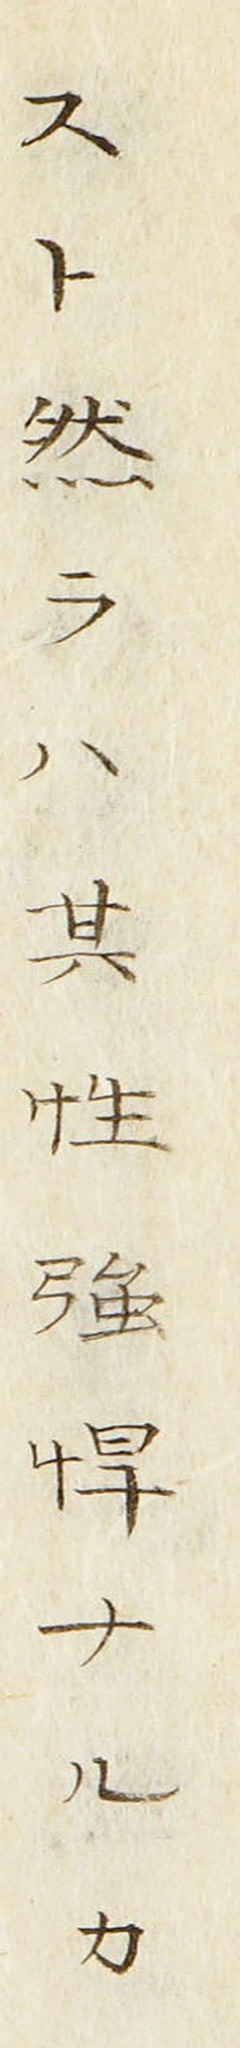スト然ラハ其性強悍ナルカ
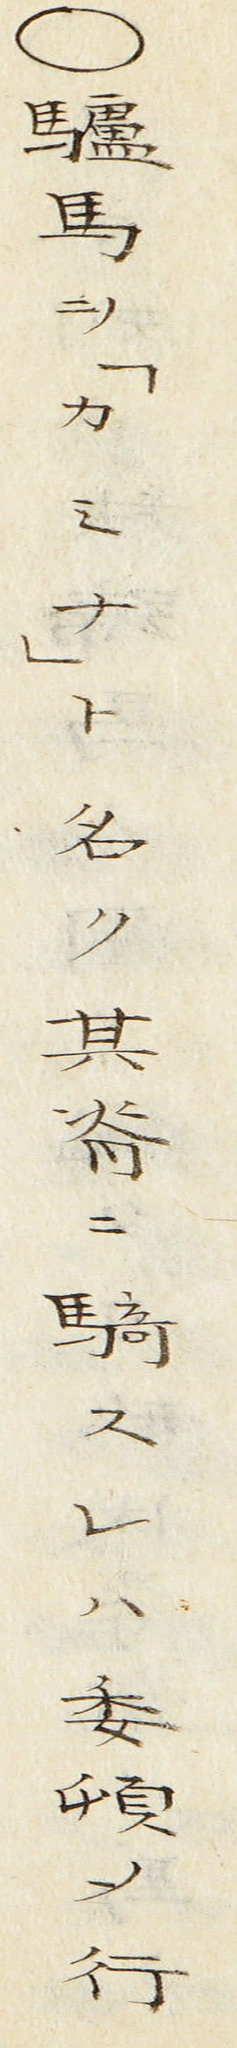〇驢馬ヲ「カミナ」ト名ク其背ニ騎スレハ委頓シテ行
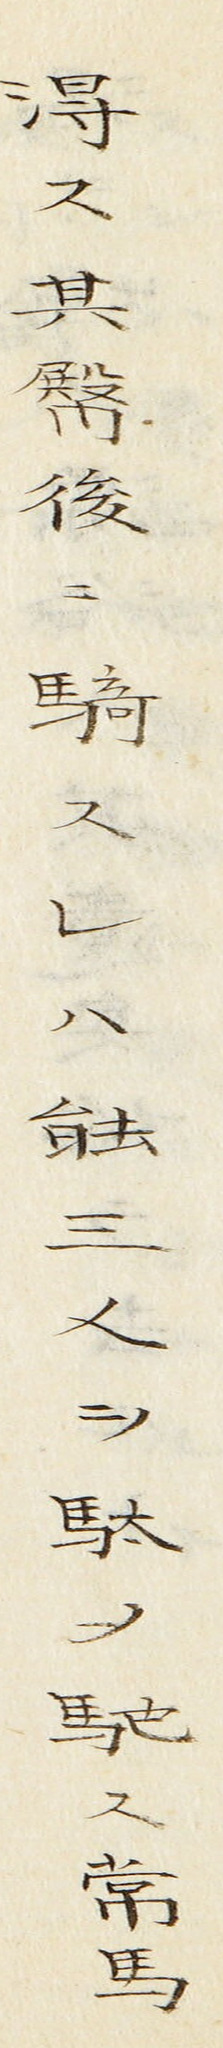得ス其臀後ニ騎スレハ能三人ヲ駄シテ馳ス常馬
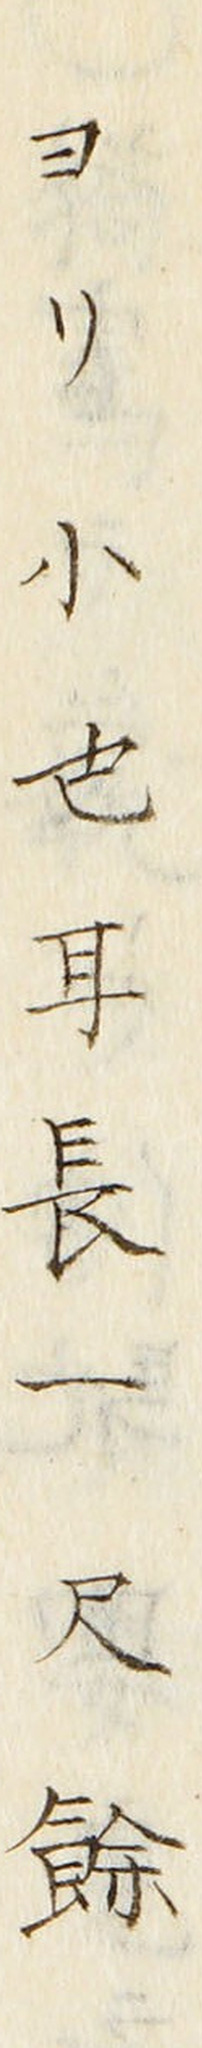ヨリ小也耳長一尺余
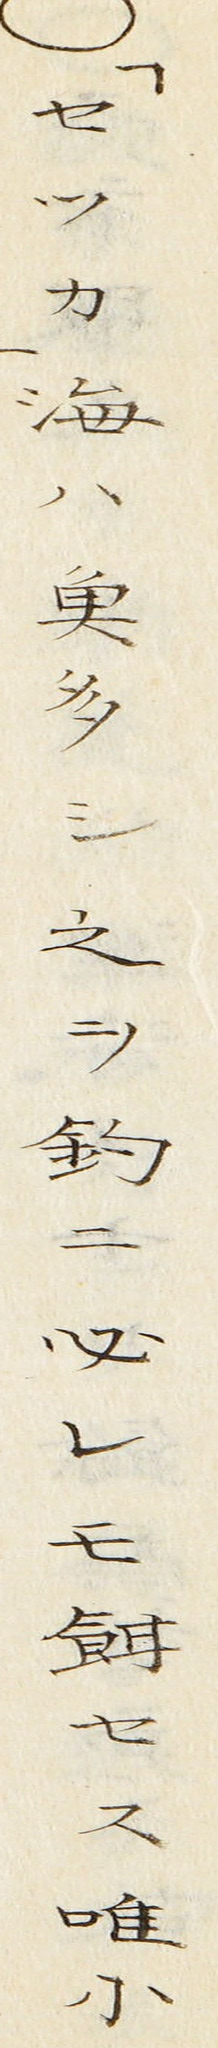〇「セツカ」海ハ魚多シ之ヲ釣ニ必シモ餌セス唯小
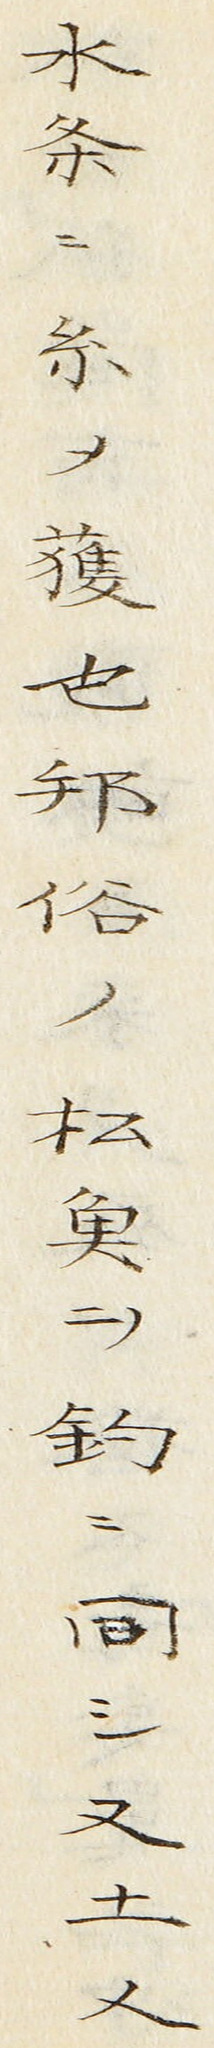水条ニ糸シテ獲也邦俗ノ松魚ヲ釣ニ同シ又土人
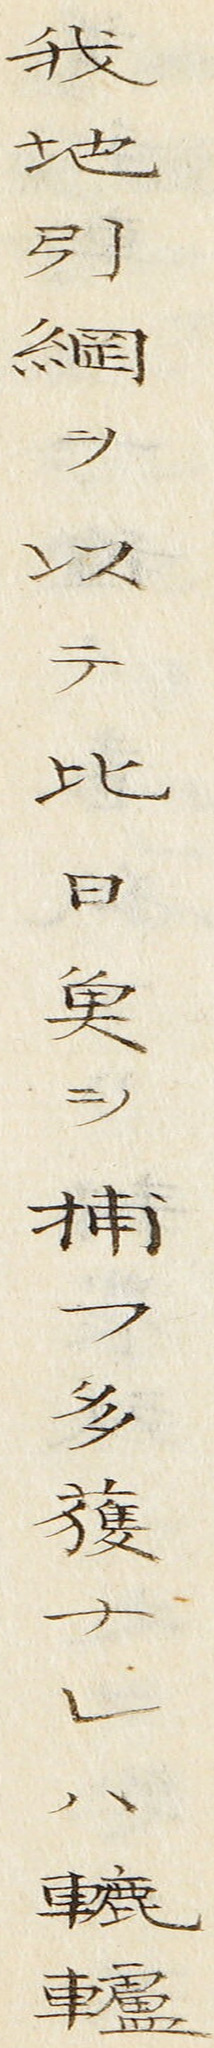我地引網ヲ以テ比日魚ヲ捕フ多獲ナレハ轆轤
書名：蕃談
